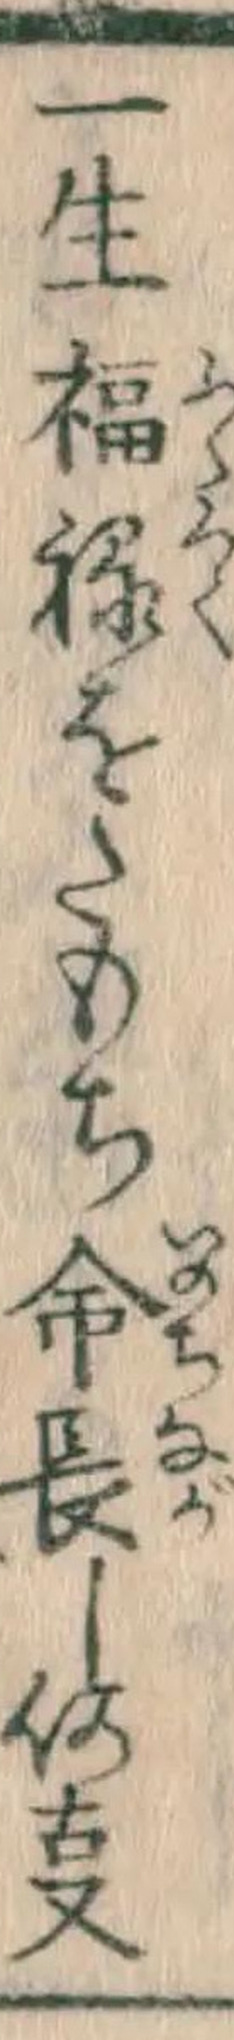一生福禄をたもち命長し何事
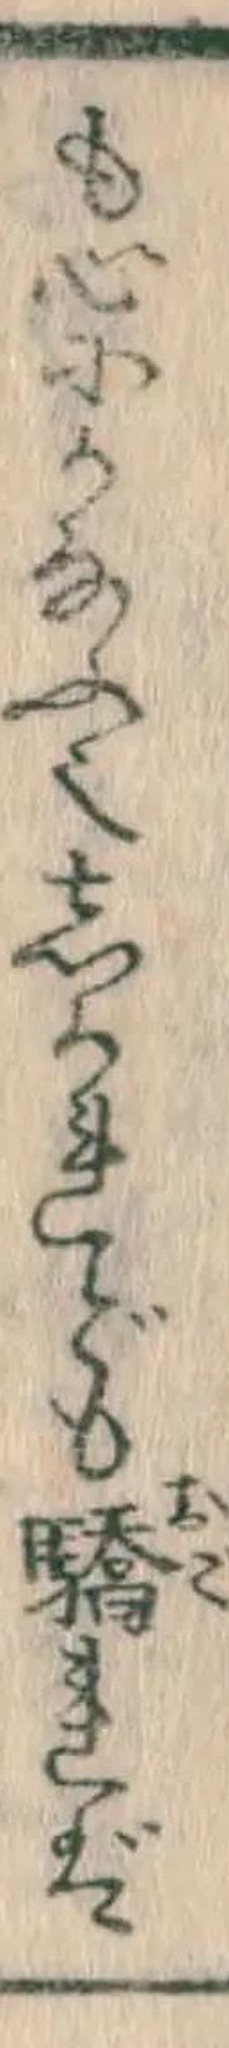も心にかなふ也しかれども驕れば
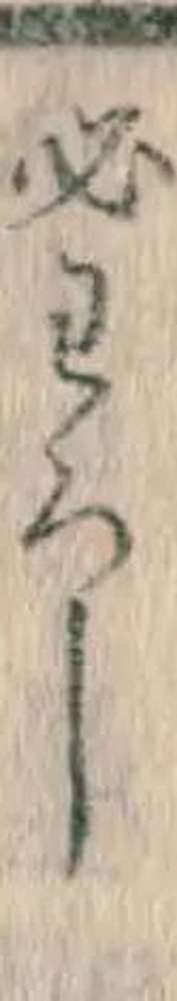必わろし
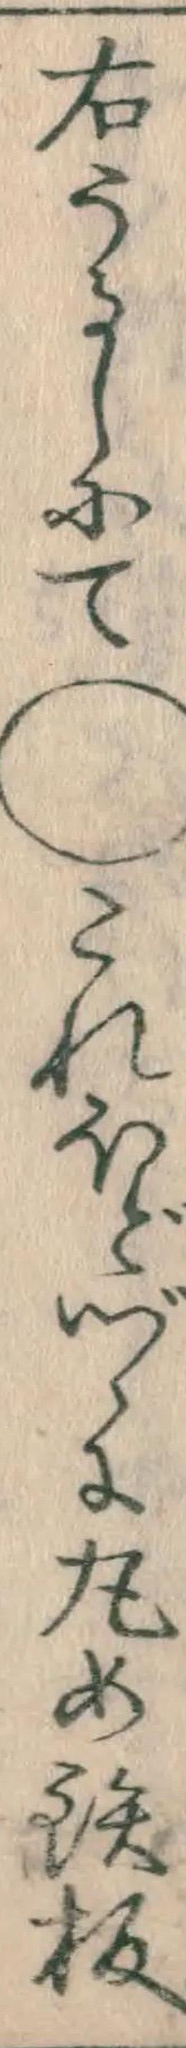右うるしにて◯これほどづゝに丸め鉄板
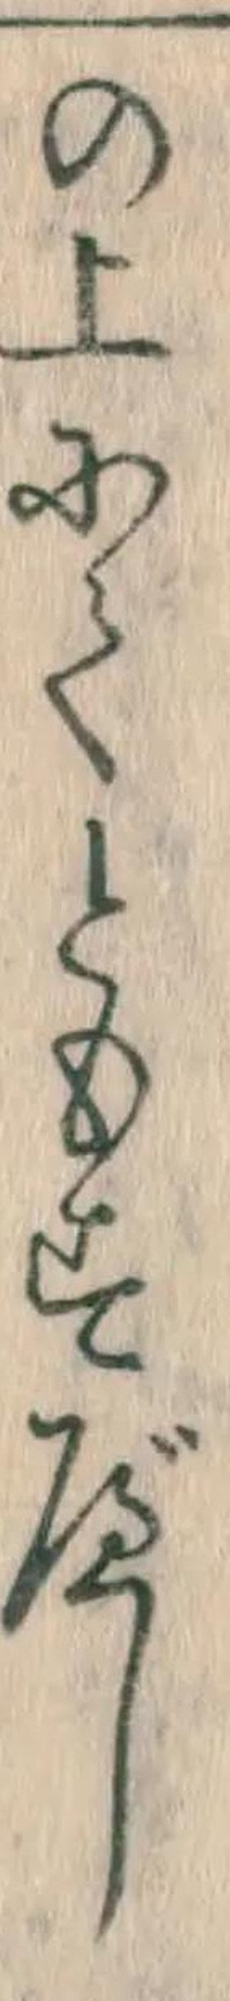の上にてともすべし
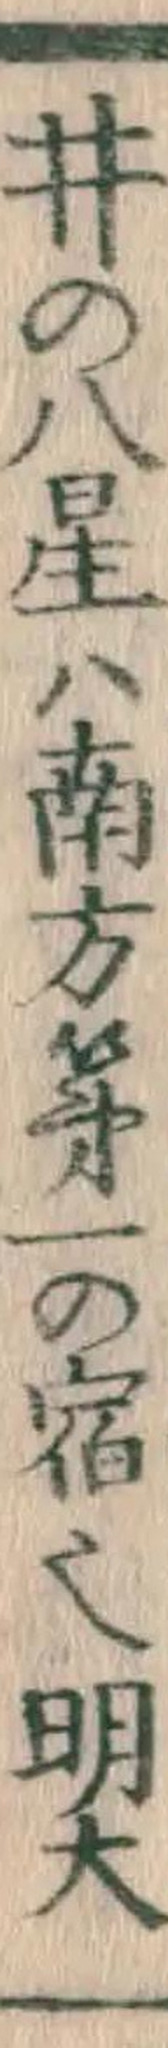井の八星は南方第一の宿也明大
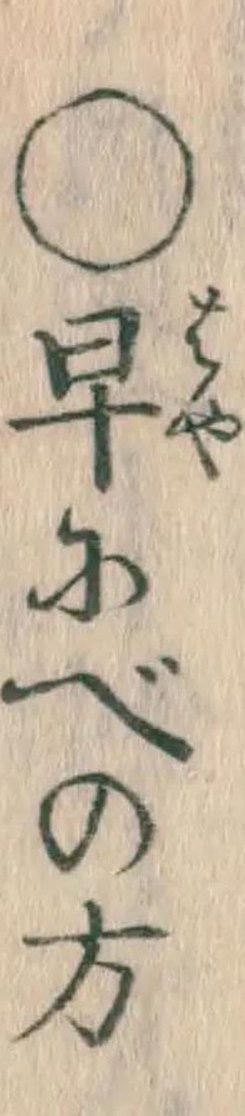○早にべの方
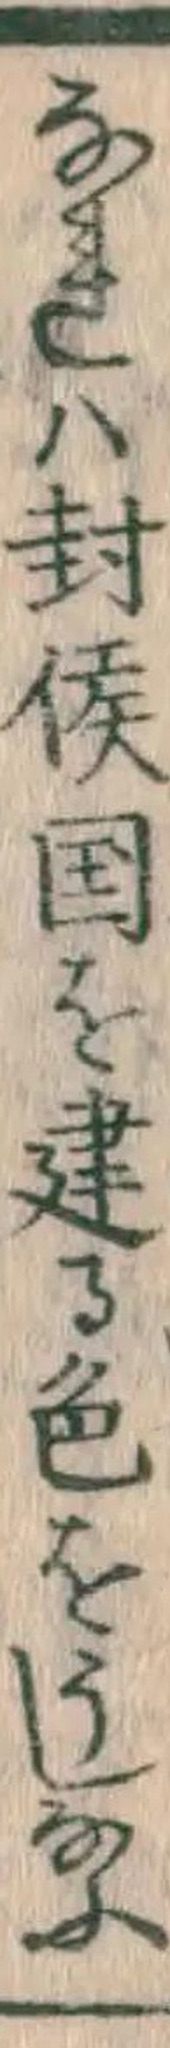なれは封侯国を建る色をうしなふ
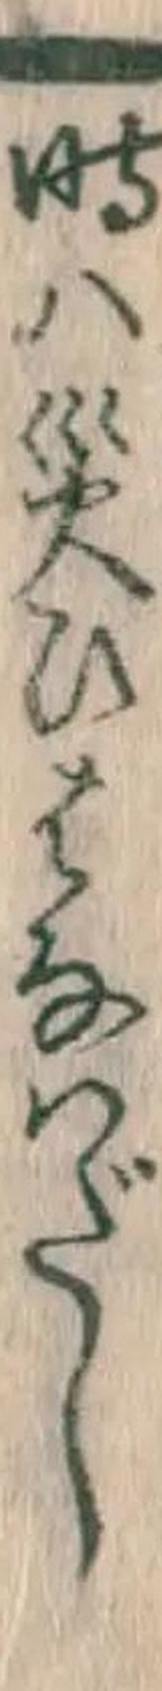時は災ひはなはだし
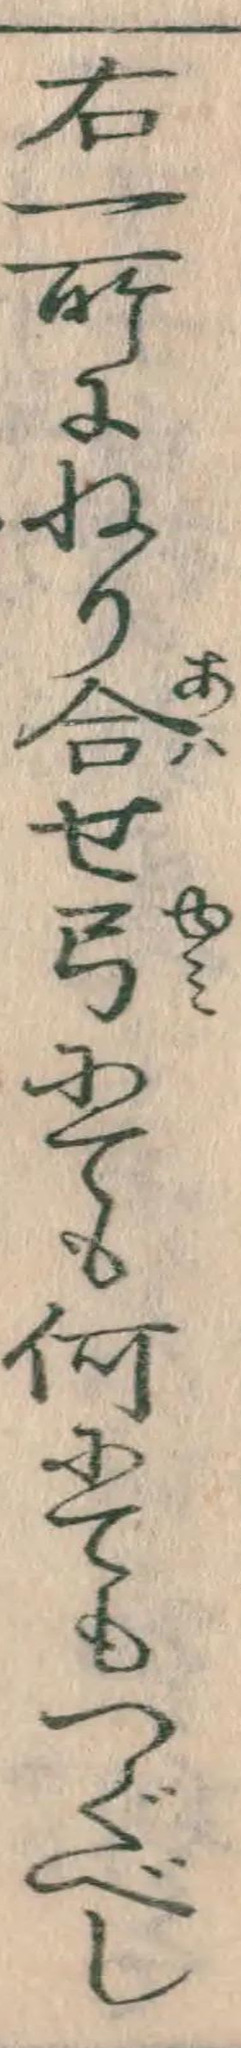右一所にねり合せ弓にても何にてもつぐべし
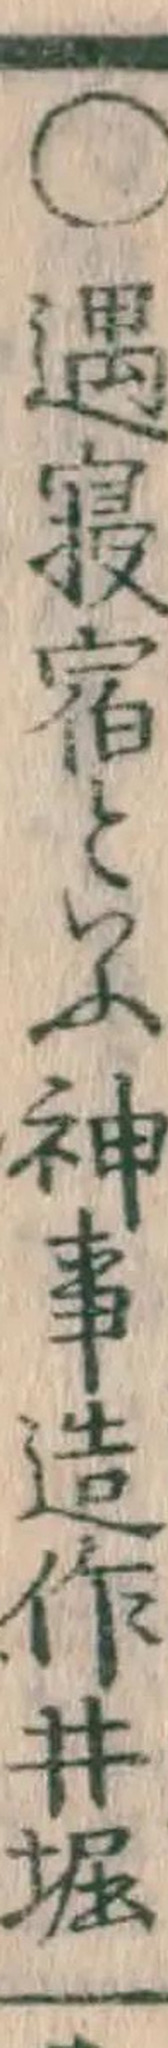○遇寝宿といふ神事造作井掘
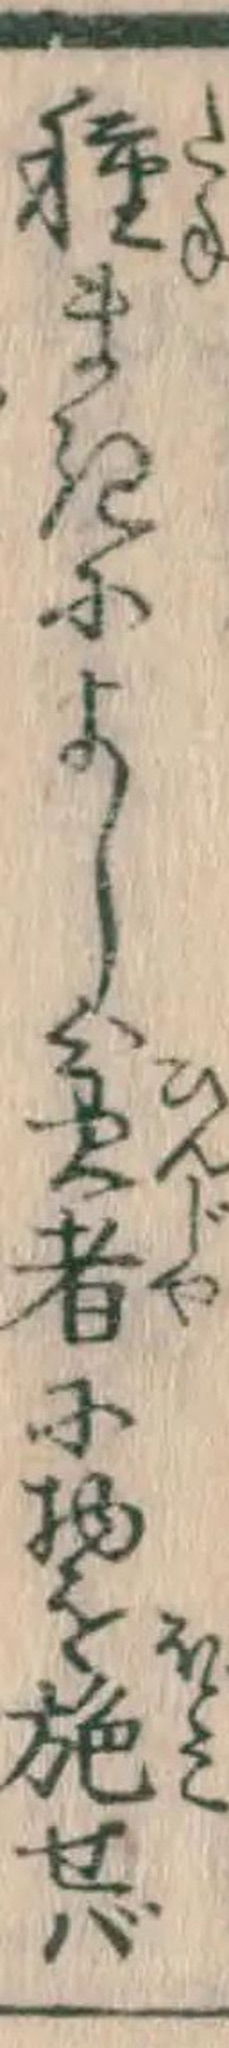種まきによし貧者に物を施せば
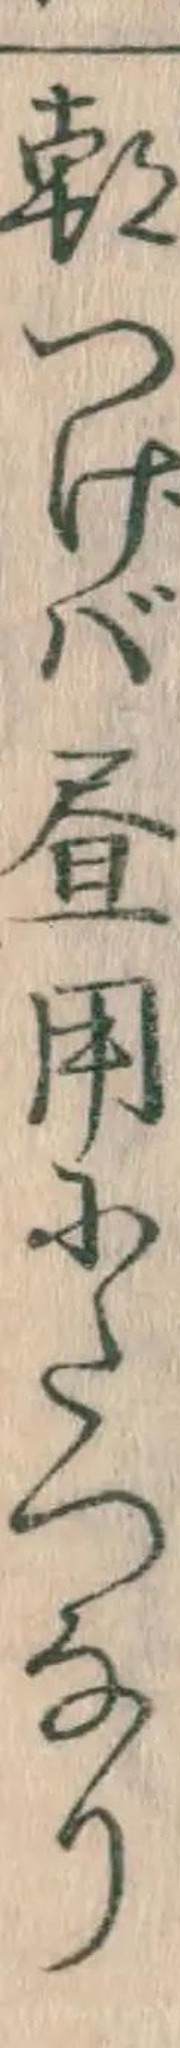朝つげば昼用にたつなり
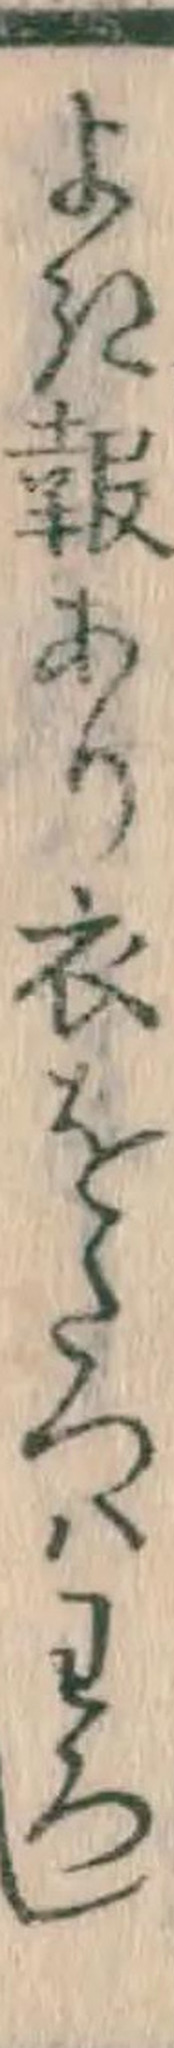よき報あり衣をたつはわろし
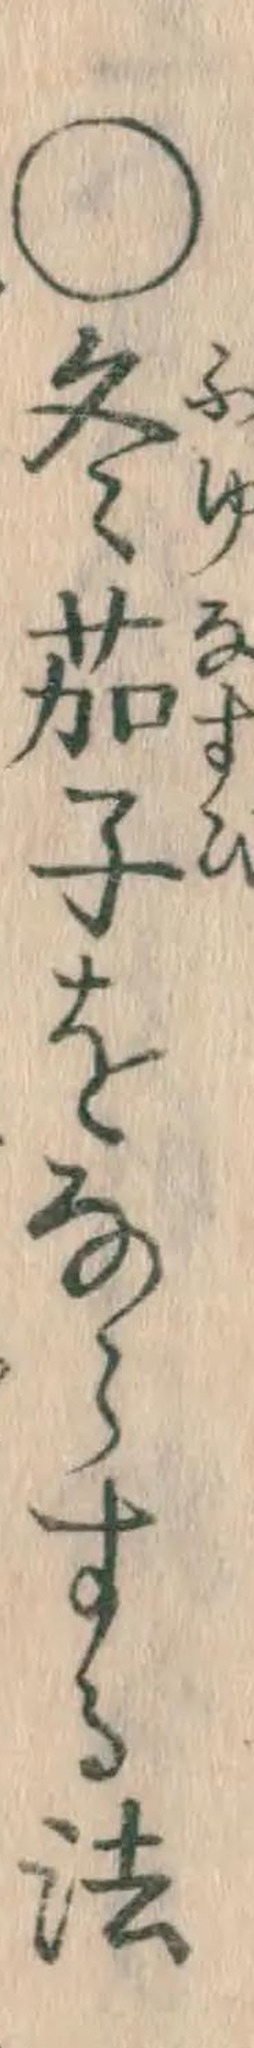○冬茄子をならする法
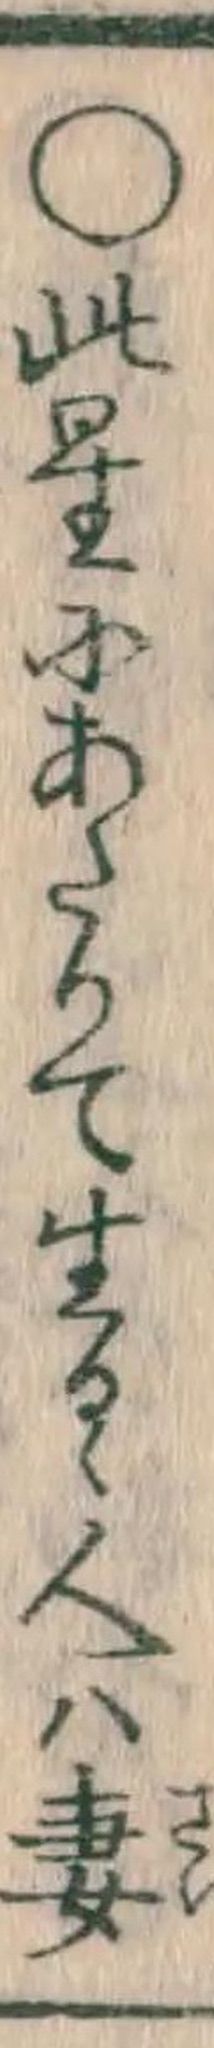○此星にあたりて生るゝ人は妻
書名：広益秘事大全 3巻. [2]
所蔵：国立国会図書館 National Diet Library, JAPAN
